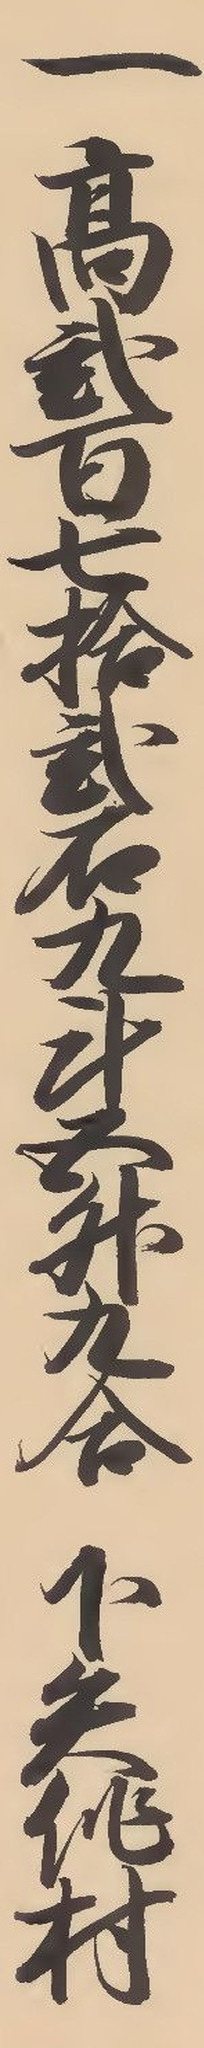一高弐百七拾弐石九斗五升九合下矢作村
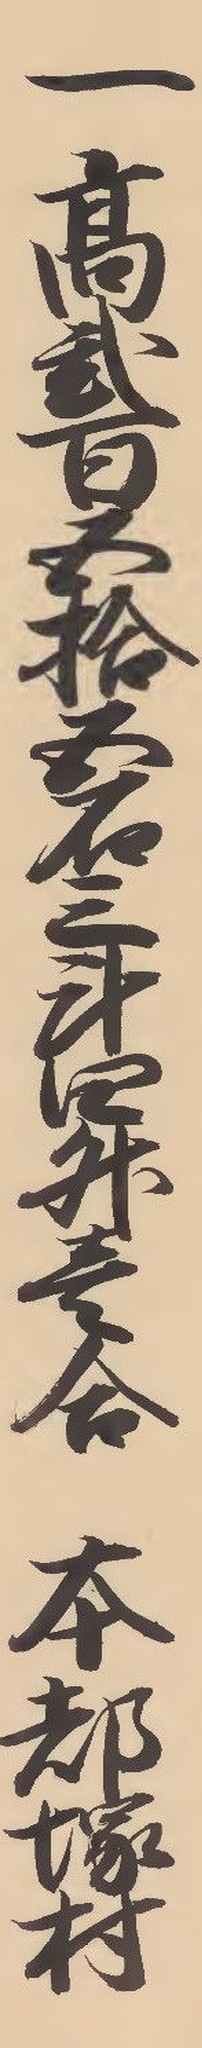一高弐百五拾五石三斗四升壱合本都塚村
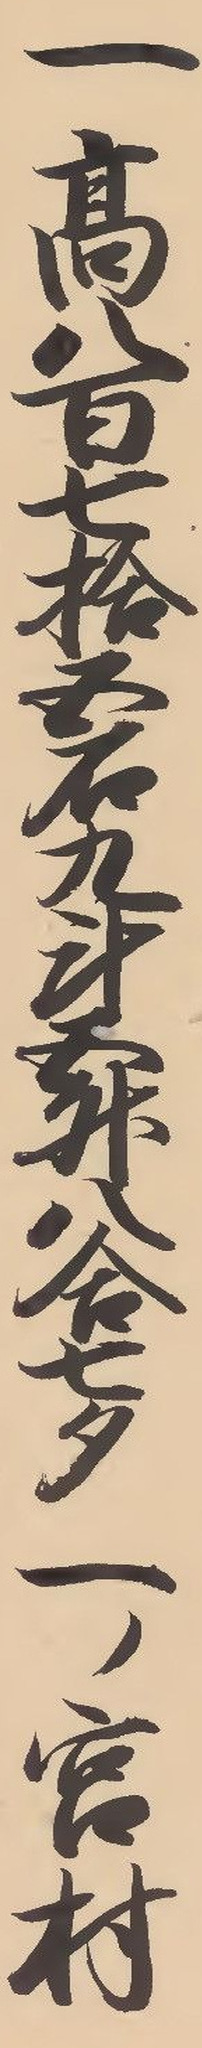一高八百七拾五石九斗五升八合七勺一ノ宮村
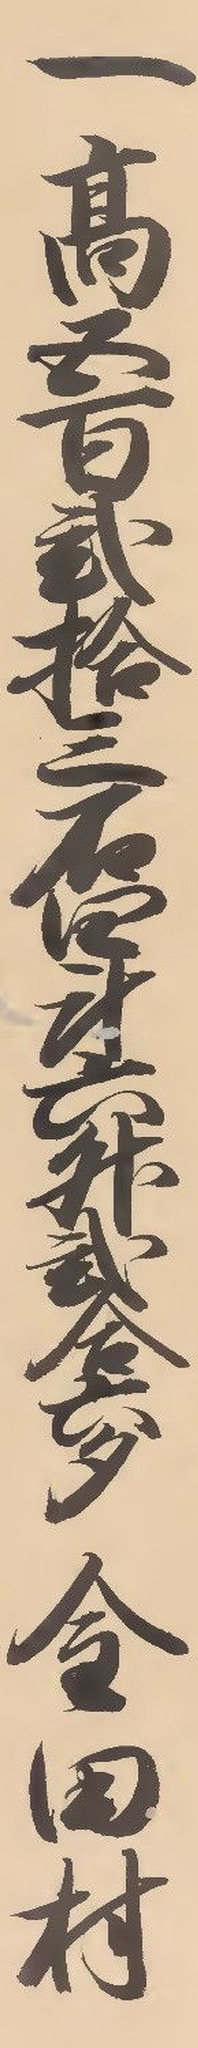一高五百弐拾三石四斗六升弐合六勺金田村
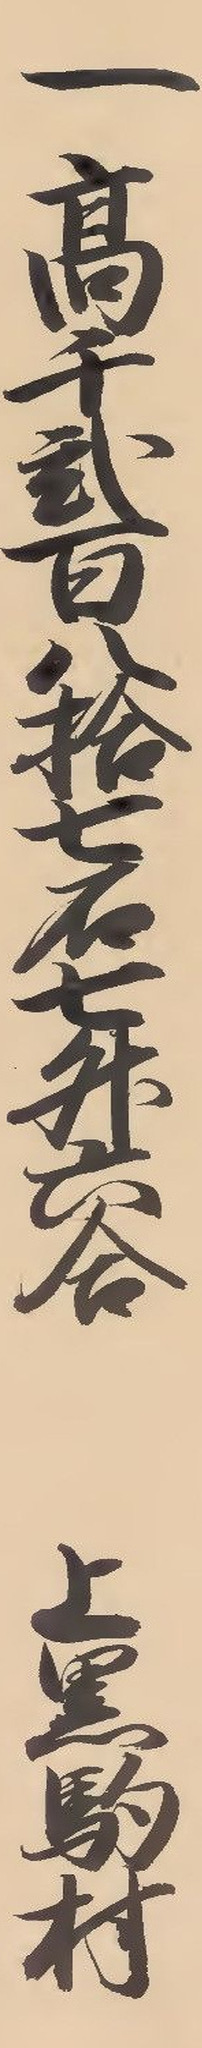一高千弐百八拾七石七升六合上黒駒村
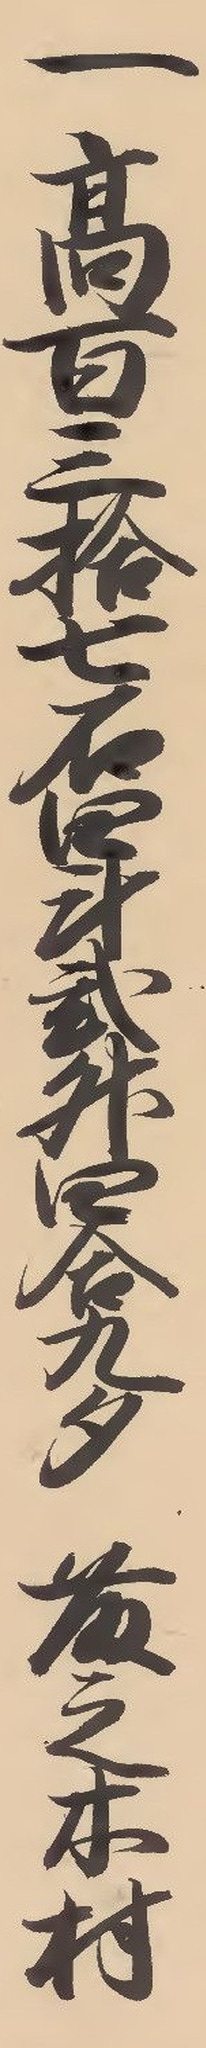一高百三拾七石四斗弐升四合九勺藤之木村
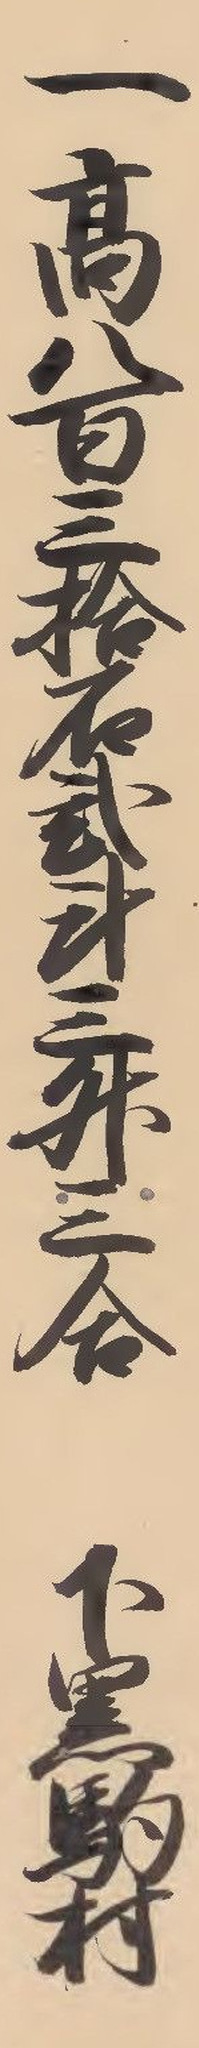一高八百三拾石弐斗三升三合下黒駒村

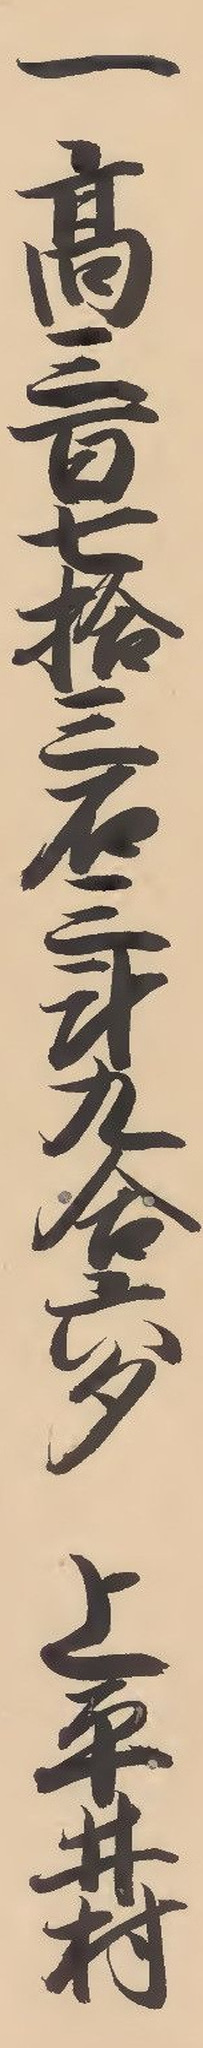一高三百七拾三石三斗九合六勺上平井村
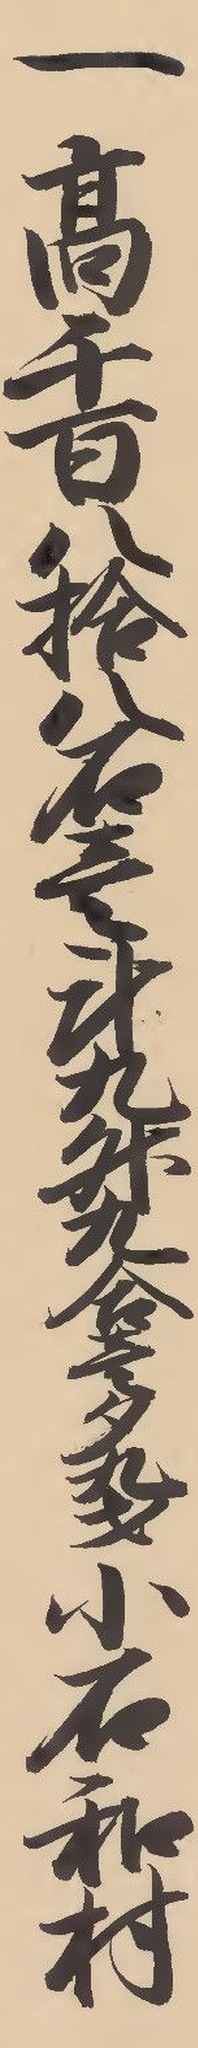一高千百八拾八石壱斗九升九合壱勺九才小石和村
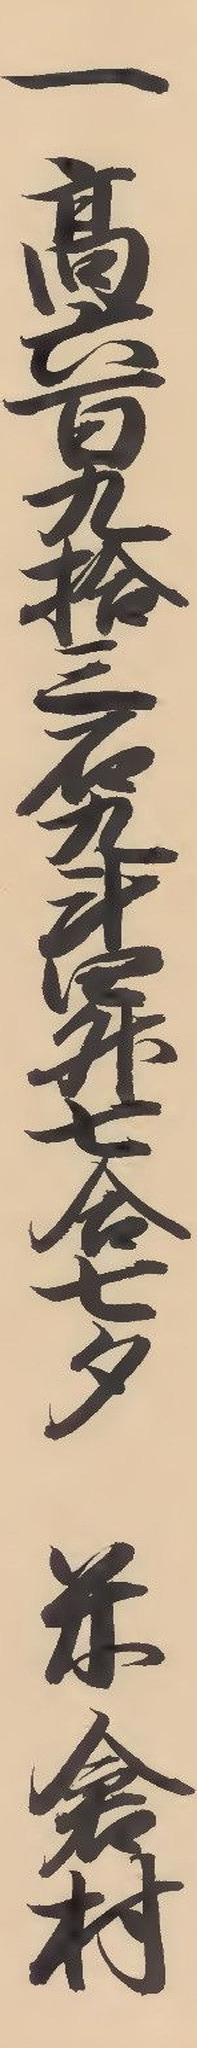一高六百九拾三石九斗四升七合七勺米倉村
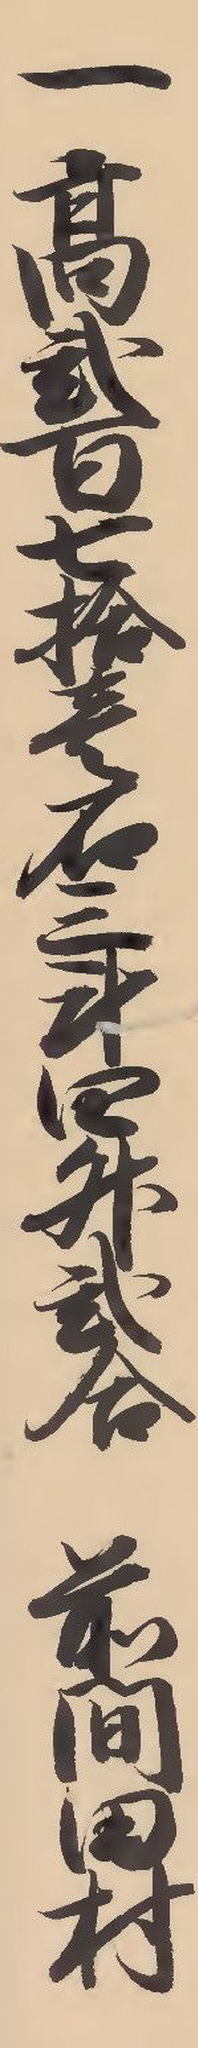一高弐百七拾壱石三斗四升弐合前間田村
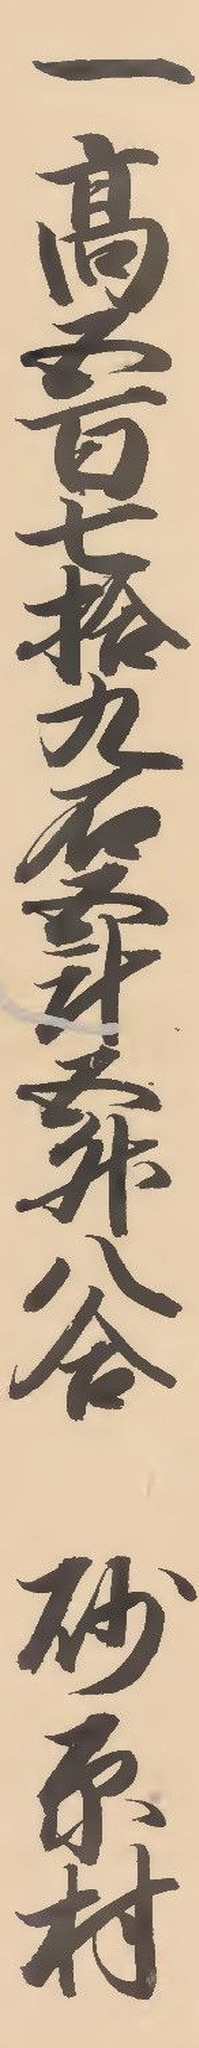一高五百七拾九石五斗五升八合砂原村
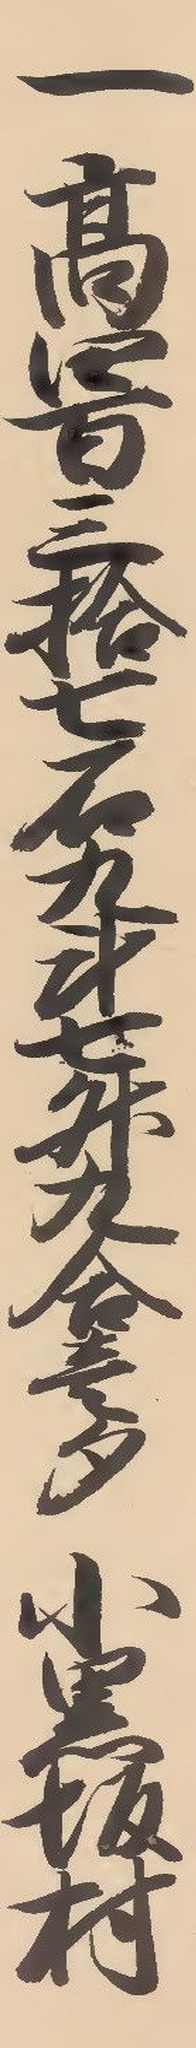一高四百三拾七石九斗七升九合壱勺小黒坂村
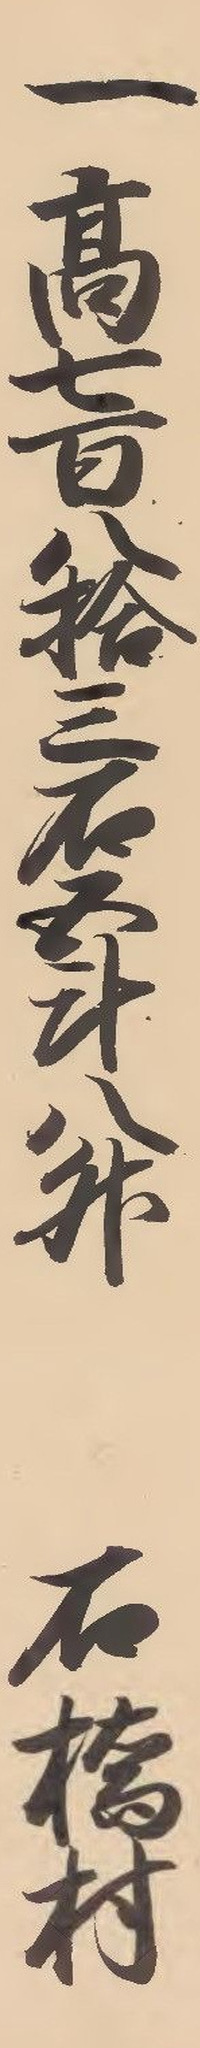一高七百八拾三石五斗八升石橋村
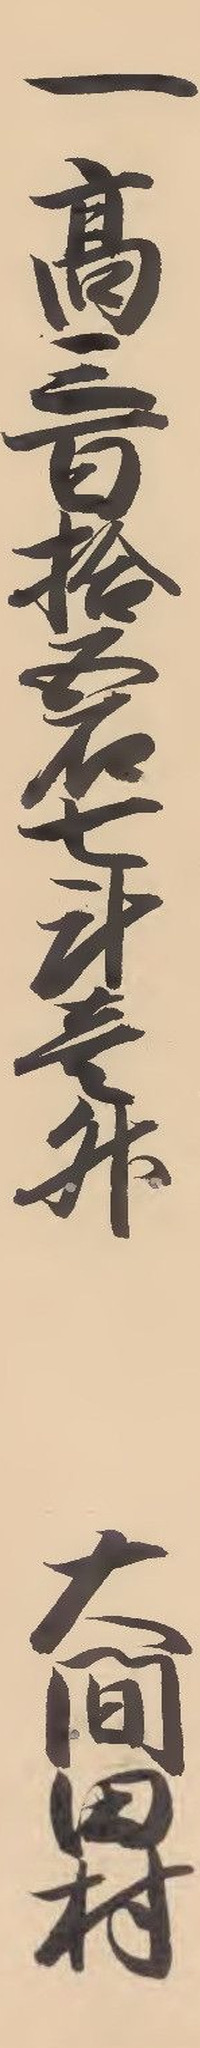一高三百拾五石七斗壱升大間田村

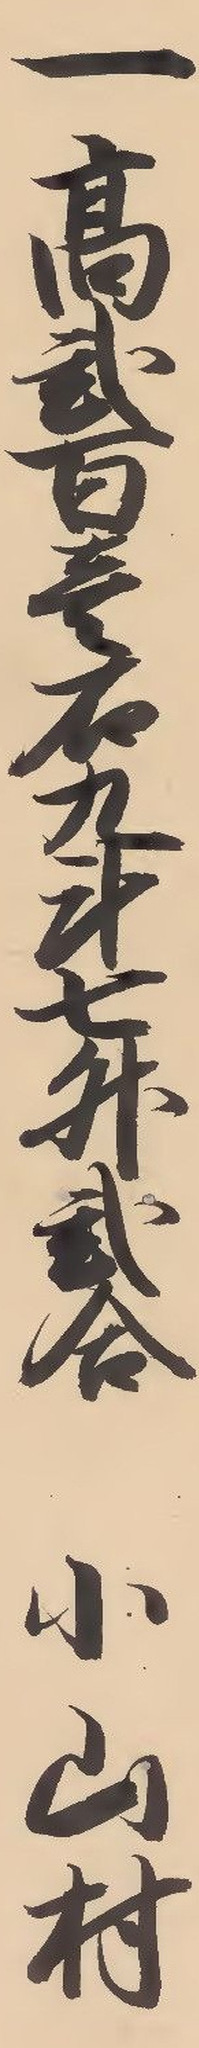一高弐百壱石九斗七升弐合小山村
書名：甲斐国郷帳
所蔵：国立公文書館 National Archives of Japan
